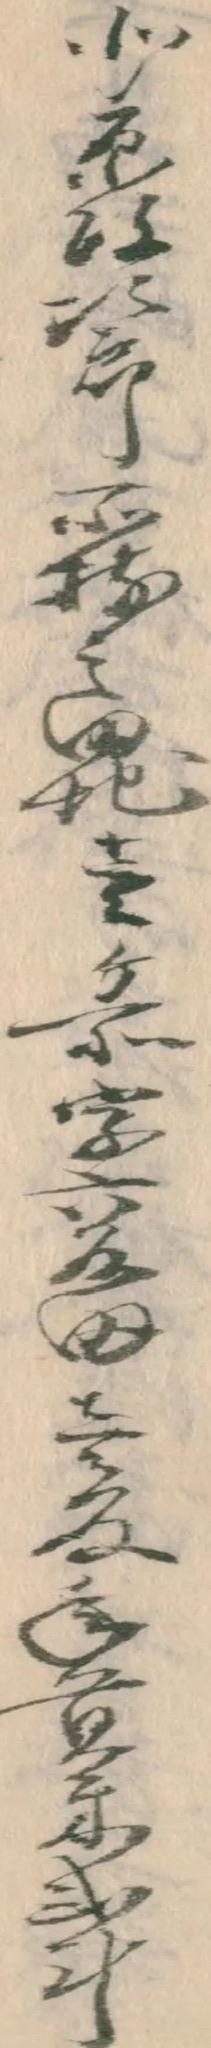北ノ原政次郎所持之田地壱ケ所字六反田壱反年貢米弐斗
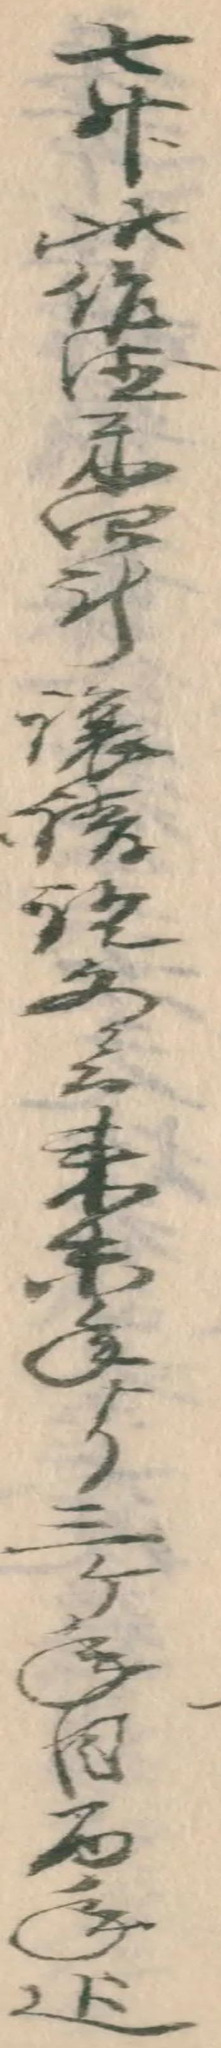七升此作徳米四斗譲請證文に而来未年より三ヶ年目酉年迄
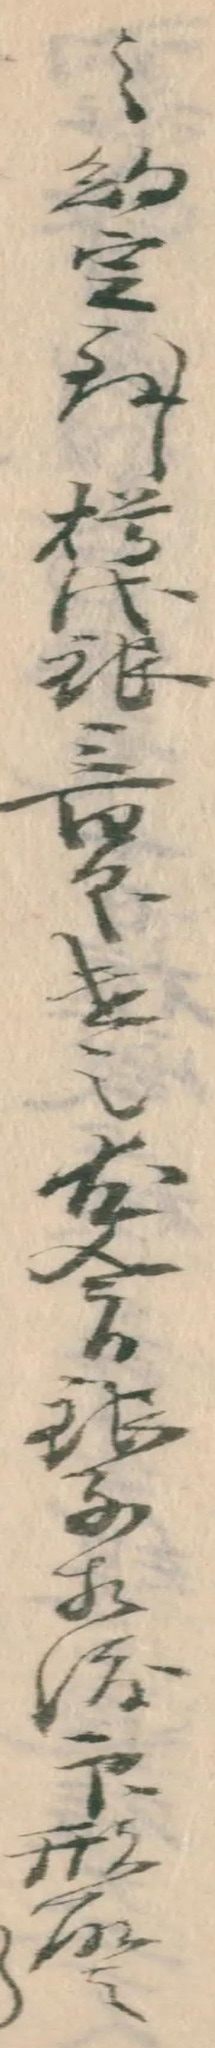之約定致し樽代銀三百匁遣之尤今日銀子相渡印形取之了
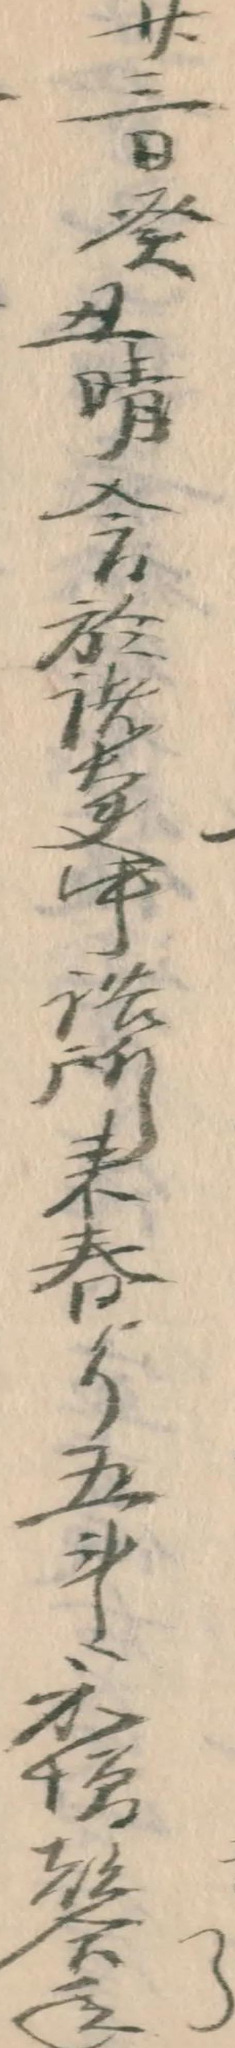廿三日癸丑晴今日於諸大夫中詰所来春より五斗御加増都合年
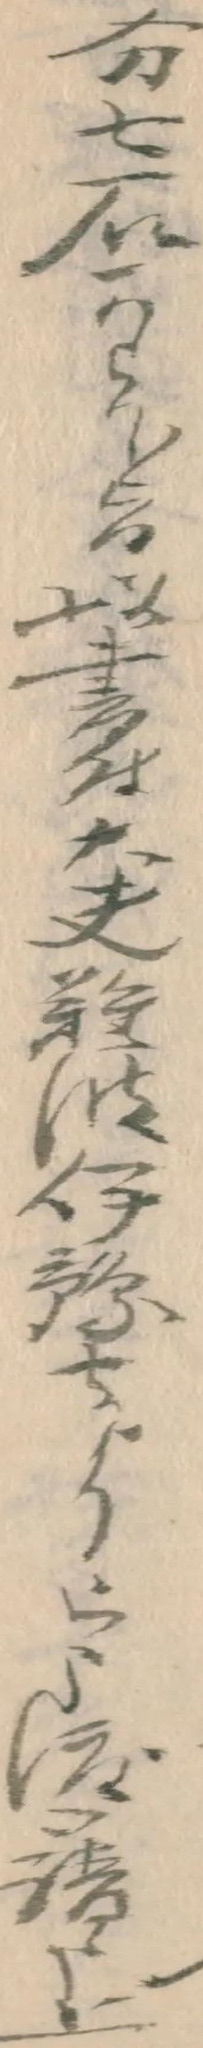分七石可被下旨以書付大夫難波伊豫守より被申渡御請申上
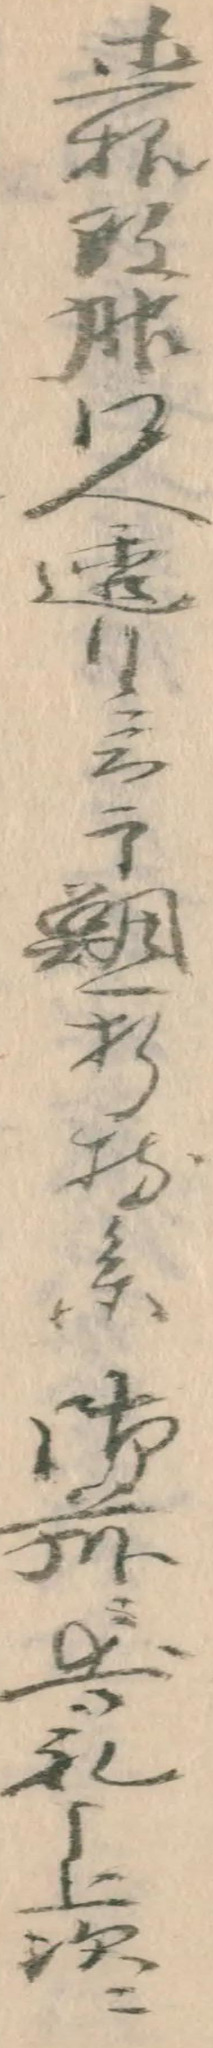直様改服同人透引ニ而干鯛一折持参御前に告礼申上次に
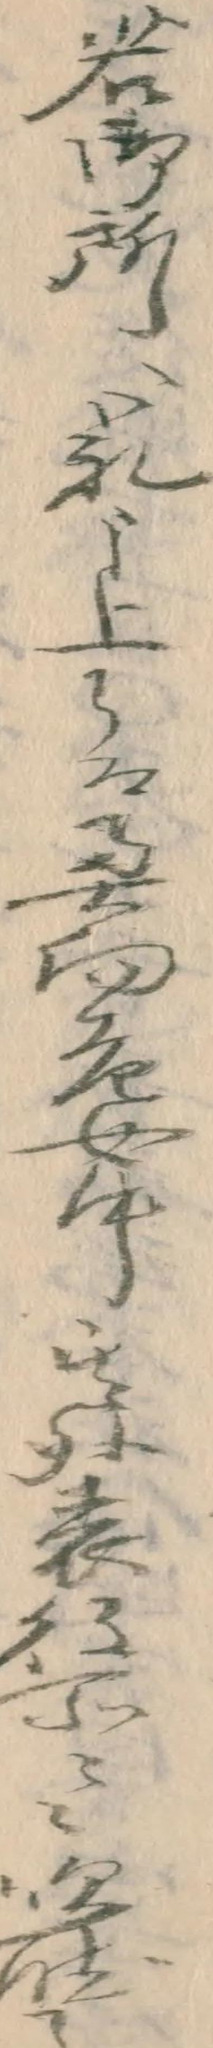若御所へ御礼申上了而奥向老女中其外表役所々々吹聴了
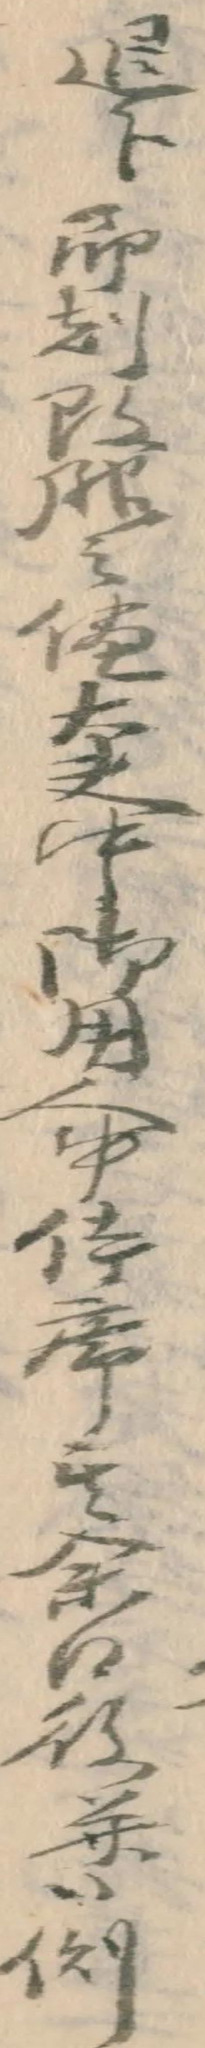退下即刻改服之大夫中御用人中侍席其余日役幷御側
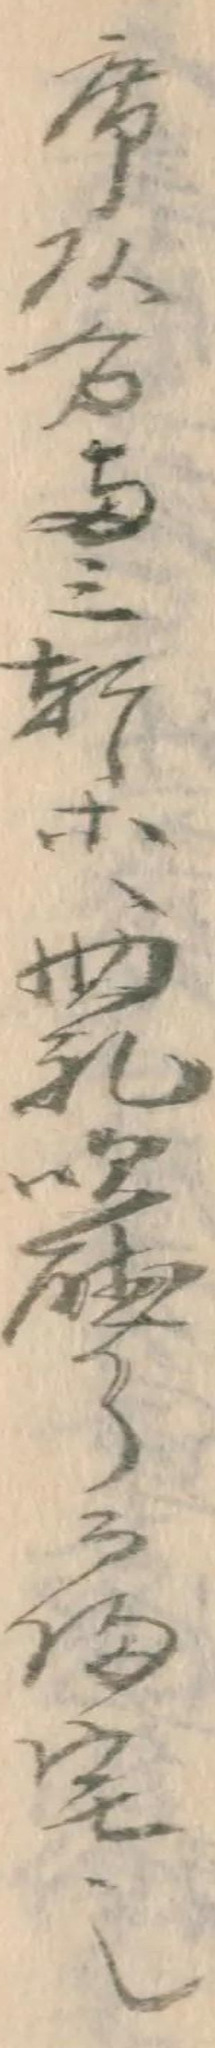席頭分両三軒等へ回礼吹聴了而帰宅也
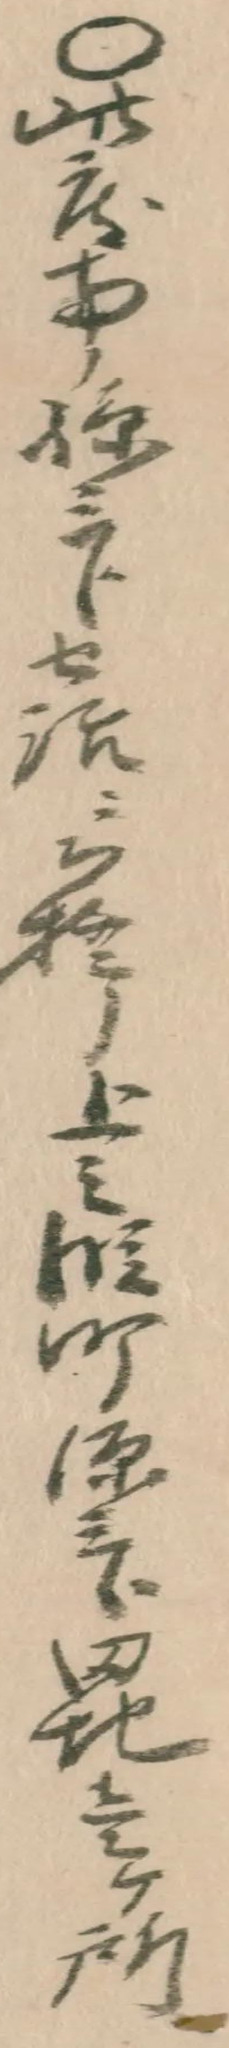○此度南ノ孫三郎世話ニ而柊ノ上之段町源三郎田地壱ヶ所
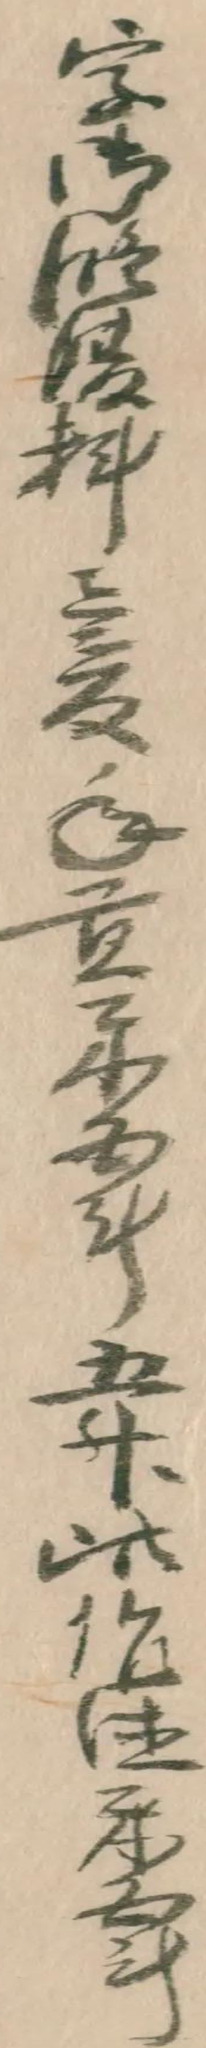字御修復料壱反年貢米五斗五升此作徳米五斗
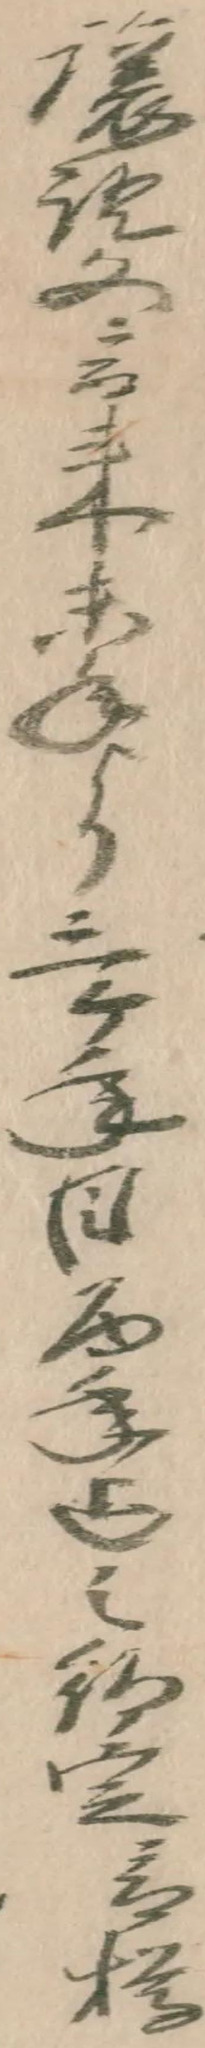譲證文ニ而来未年より三ヶ年目酉年迄之約定ニ而樽
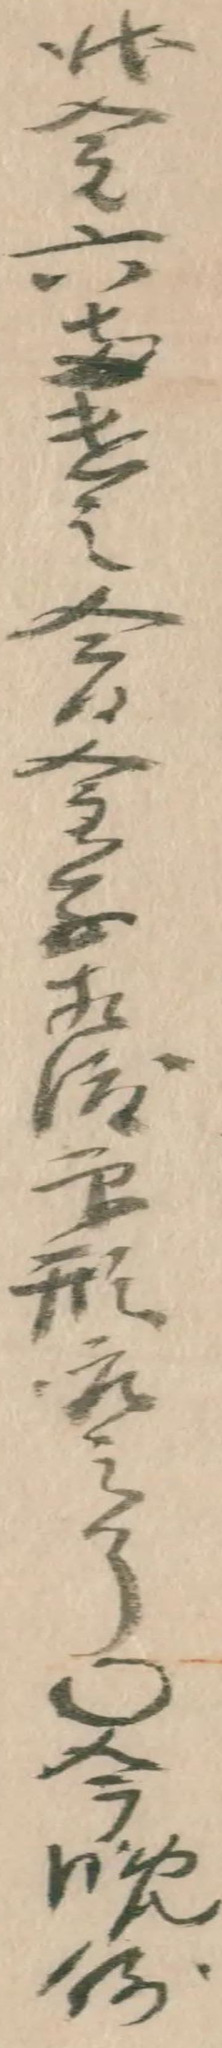代金六両遣之今日金子相渡印形取之了○今晩例
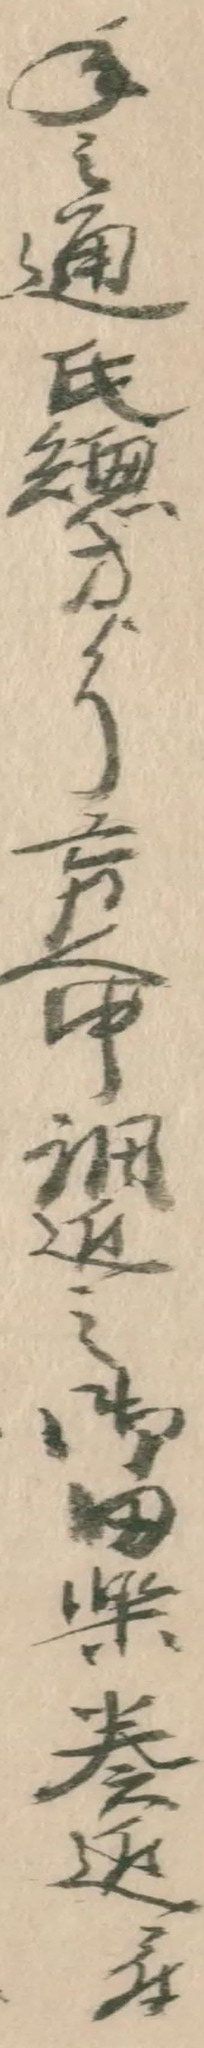年之通氏總方より盲人中調進之御田楽奏近ニ付
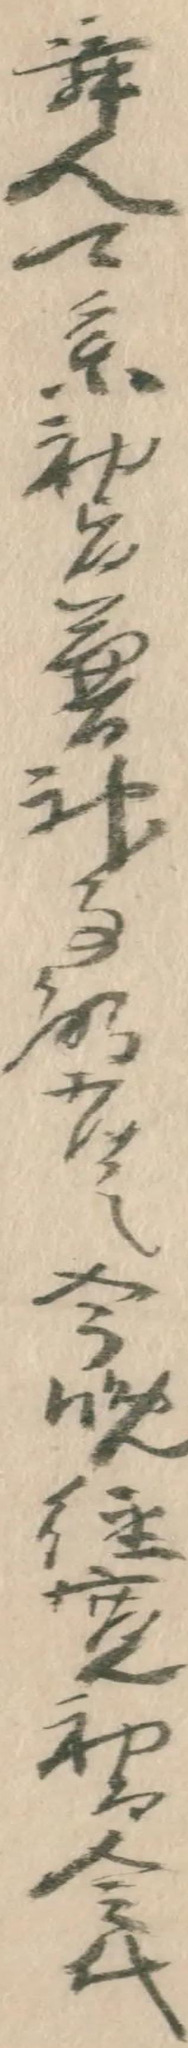舞人可参勤旨兼日神事觸有之今晩経覚初而令代
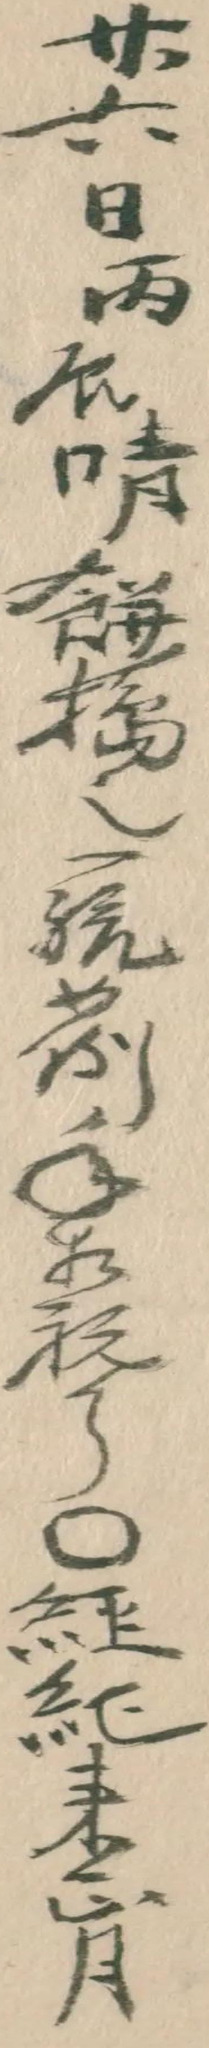廿六日丙辰晴餅搗也一統如例年相祝了○経紀来正月
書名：賀茂社記録. 第66冊
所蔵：国立国会図書館 National Diet Library, JAPAN
